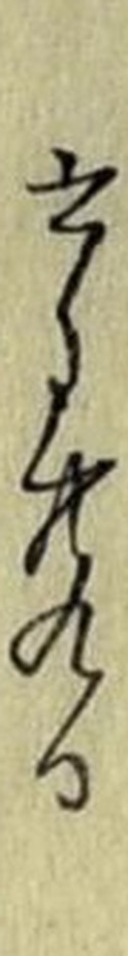六月廿九日
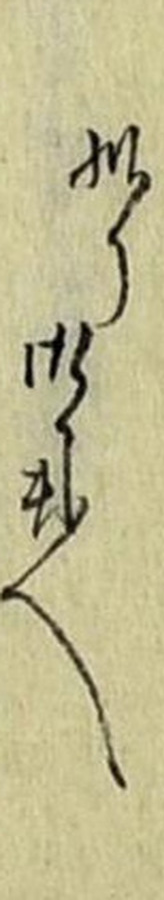掛り御用人
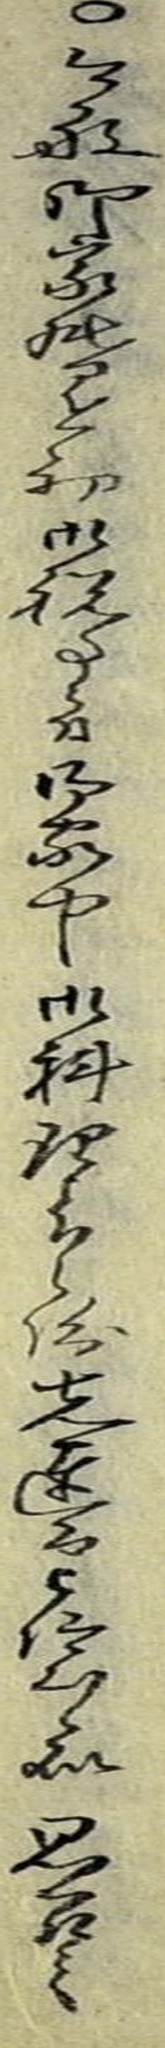○今般御家督を初御祝事に付御家中御料理被下候儀先達而被仰出候処思召之
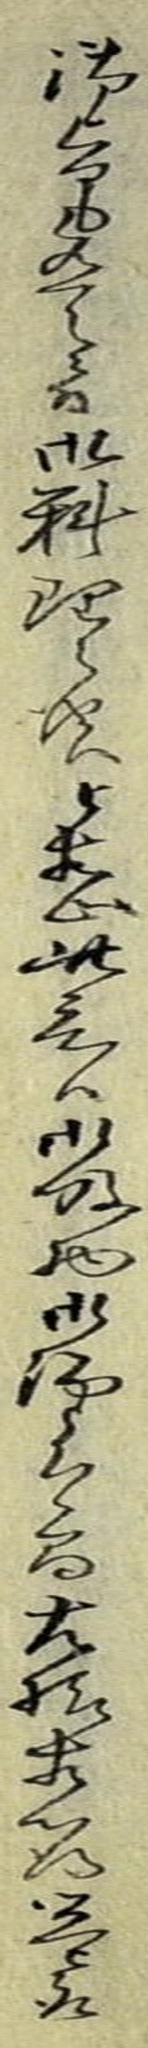御旨も有之候に付御料理之儀は被相止此度は御吸物御酒被下候間左様相心得宜被取
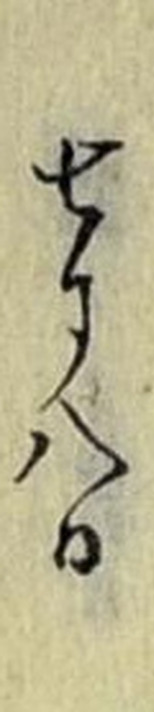七月八日
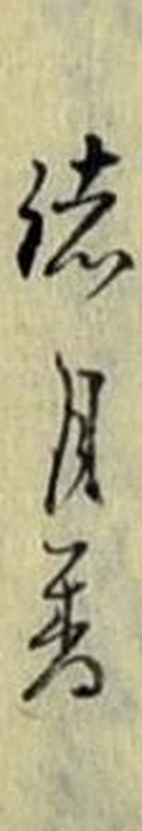諸月番
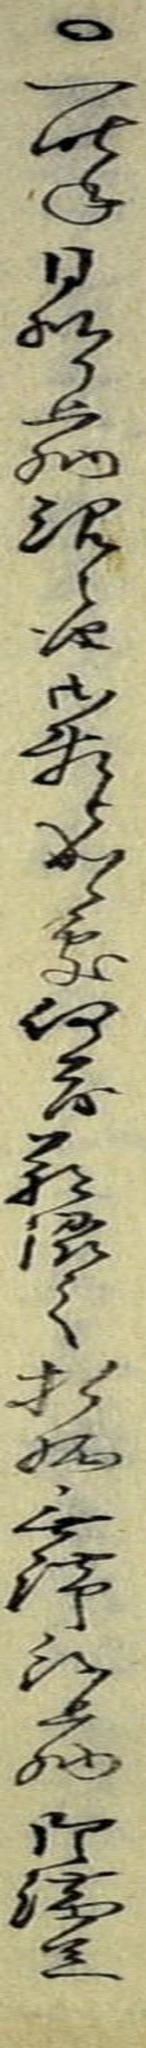○一昨年日掛り上納銀之儀御頼被成候処何も難渋之折柄無滞致上納御満足
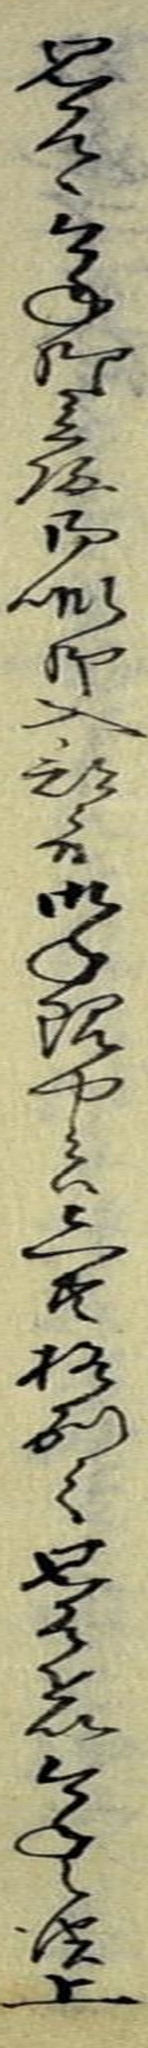思召候今年御立帰御暇御入部に付御年限中には候得共格別之思召を以今年之儀上
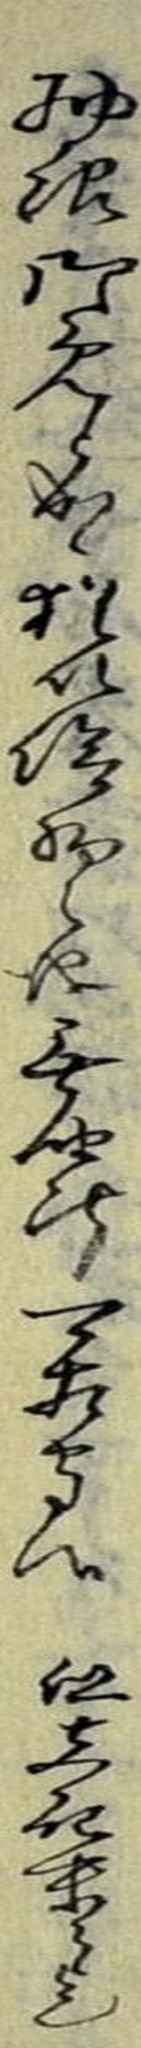納銀御免被成候猶以倹約之儀無由断可相守候但支配末々迄
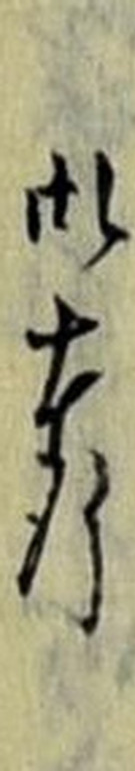御奉行
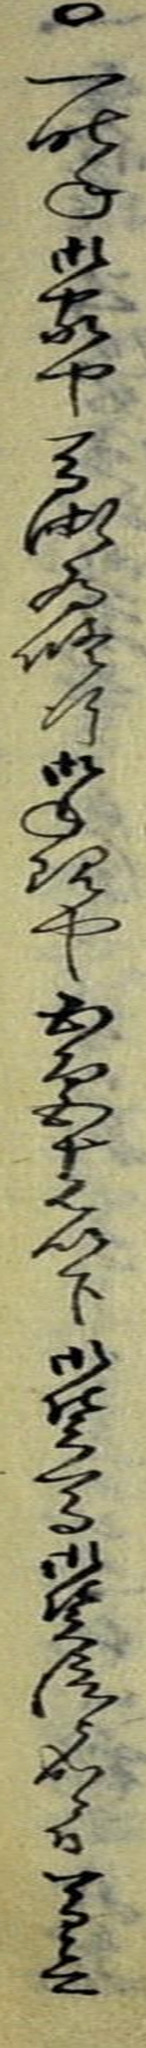○一昨年御家中馬術為修行御年限中五百五十石以下御貸馬御貸渡被成候に付馬壱
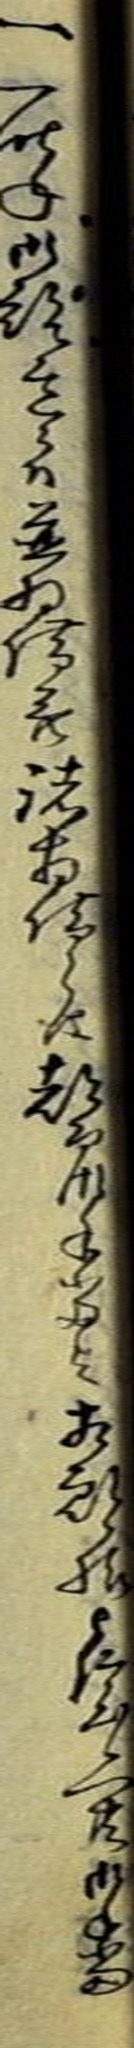一一昨年御趣意に付並拝借并諸拝借之儀都而御手当と相願候様被仰出候へ共御手当
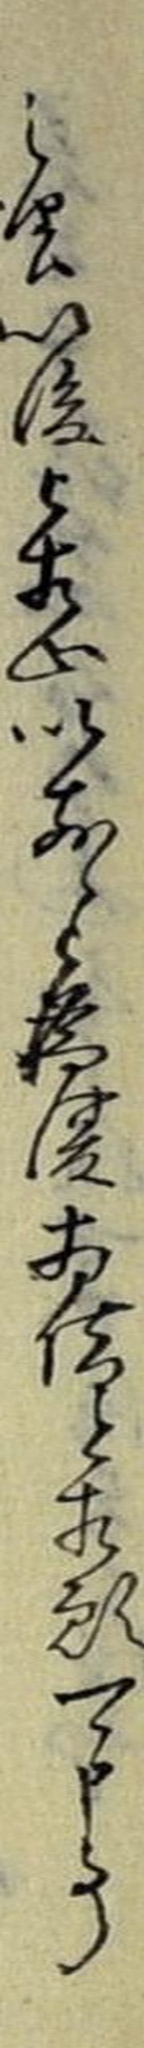之儀は以後被相止以前に被為復拝借と相願可申事
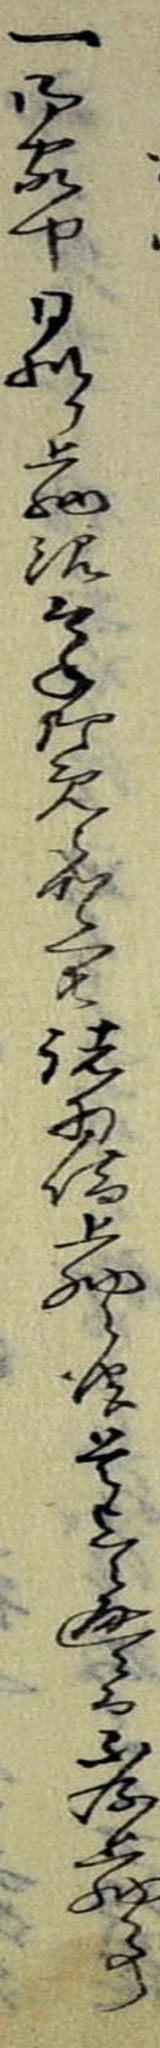一御家中日掛り上納銀今年御免被成候へ共諸拝借上納之儀は是迄之通に而不及上納候事
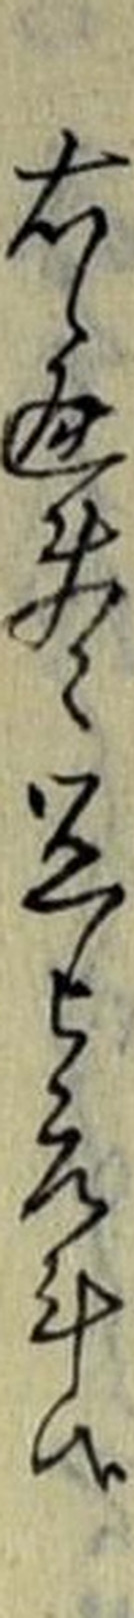右之通夫々宜被取斗候
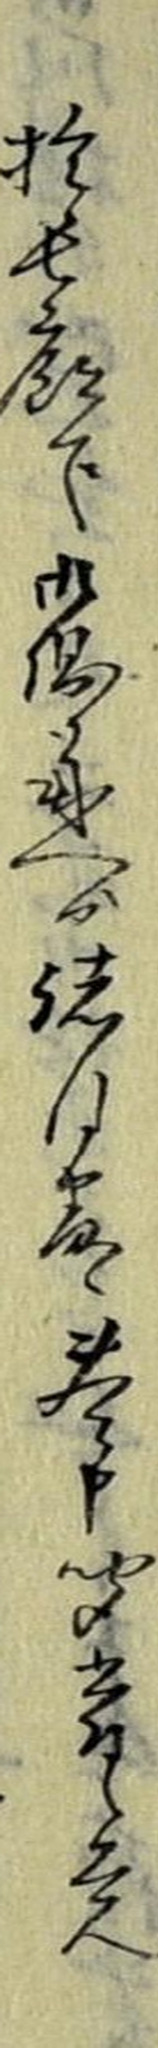於長廊下御側御用人ゟ諸月番へ夫々申聞書付之覚
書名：命令之部 六
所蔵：福井県文書館 Fukui Prefectural Archives
